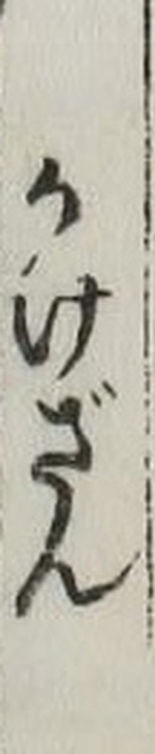かけざん

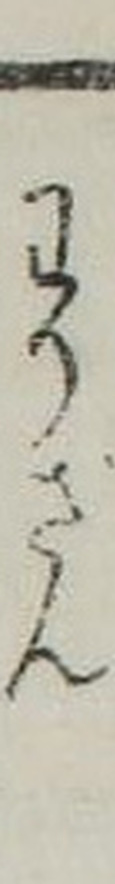わりざん
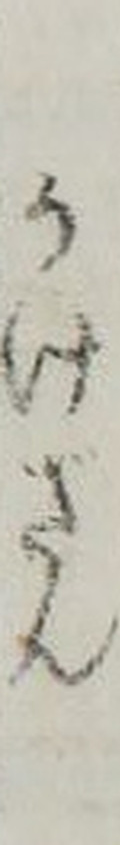かけざん
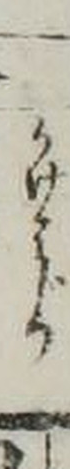かけはじめ
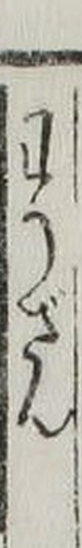わりざん
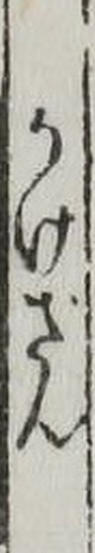かけざん

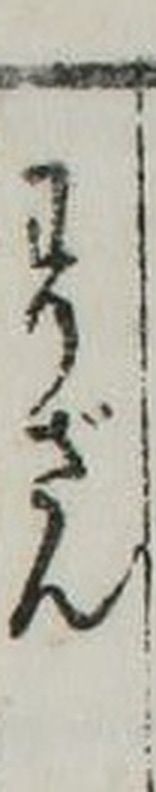わりざん
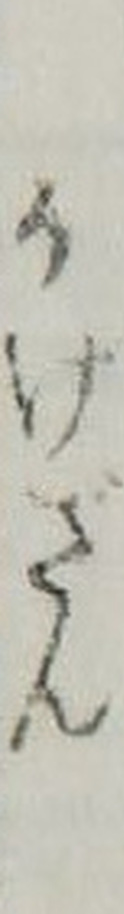かけざん

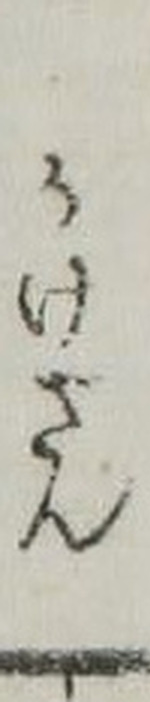かけざん
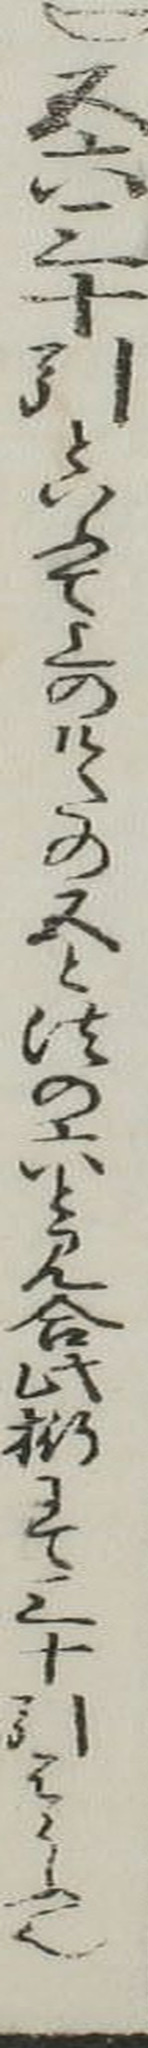石◆㊁五六三十引といふて上のけたの五と法の六と見合此桁にて三十引はらふ也
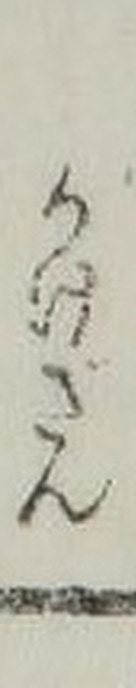かけざん

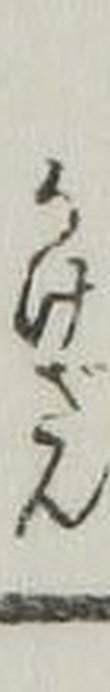かけざん
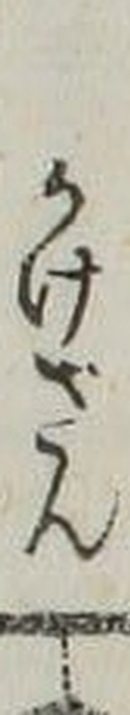かけざん

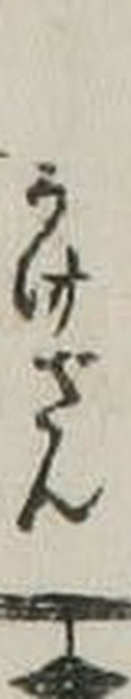かけざん
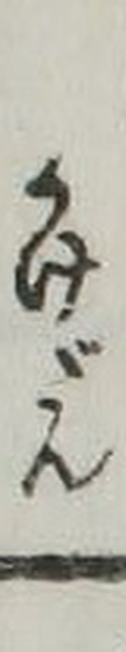かけざん

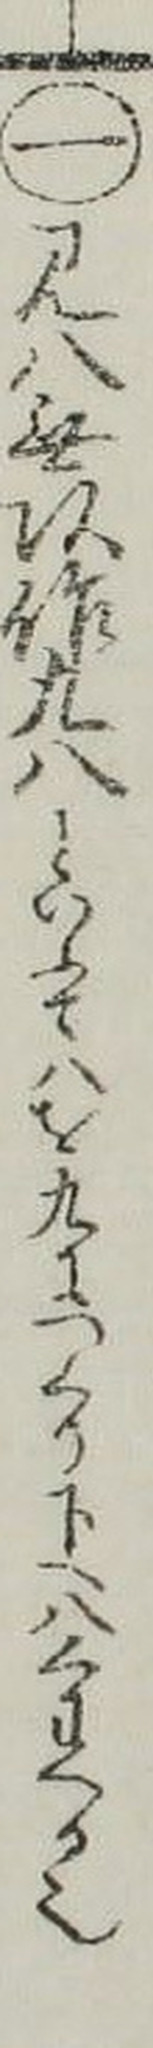十◆㊀見八無頭作九八といふて八を九につくり下へ八くわへる也
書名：宝玉塵劫記
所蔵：東京学芸大学教育コンテンツアーカイブ
